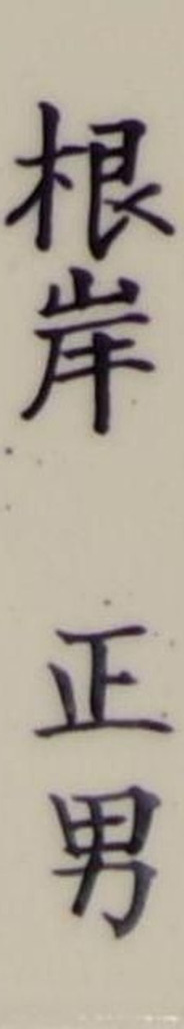根岸正男

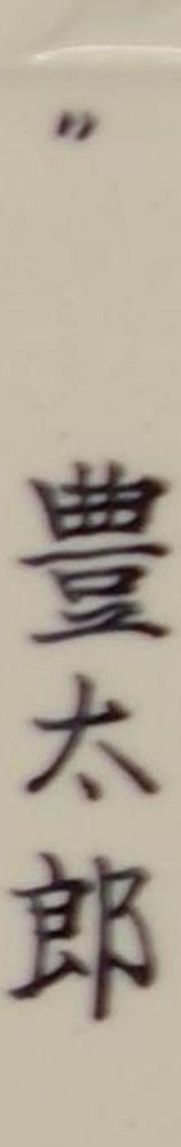豊太郎
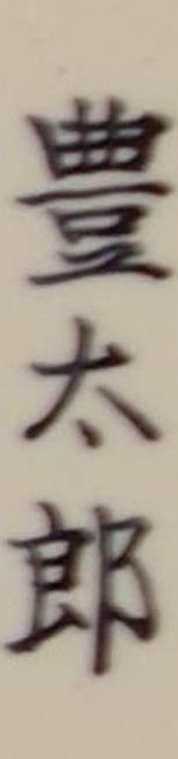豊太郎
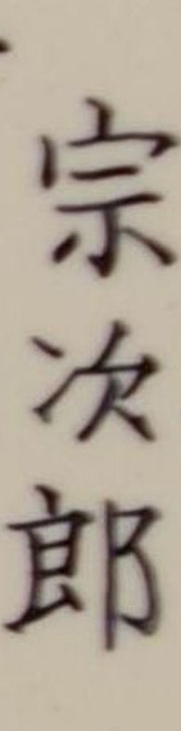宗次郎
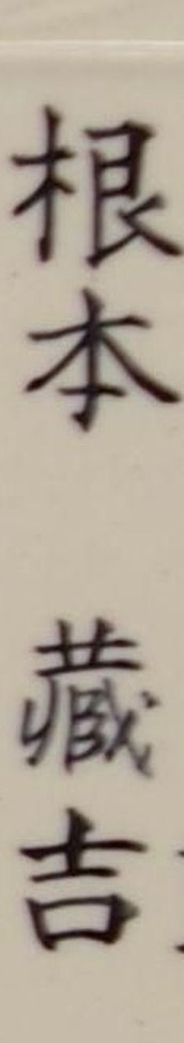根本蔵吉
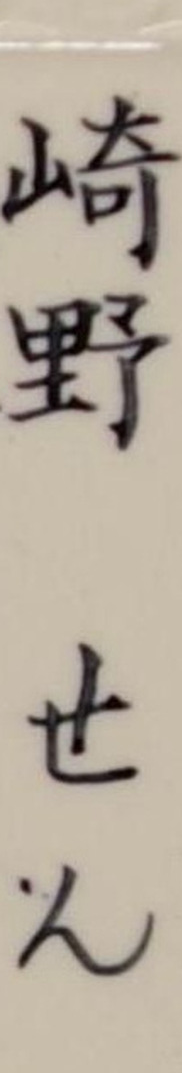崎野せん
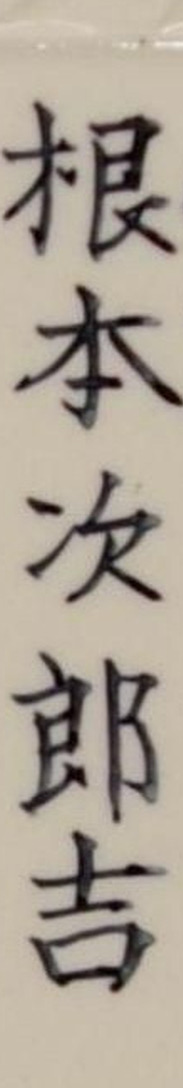根本次郎吉
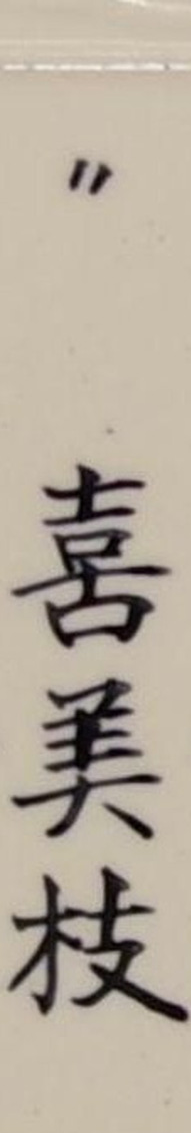喜美枝
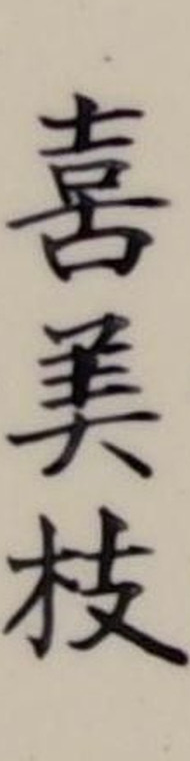喜美枝
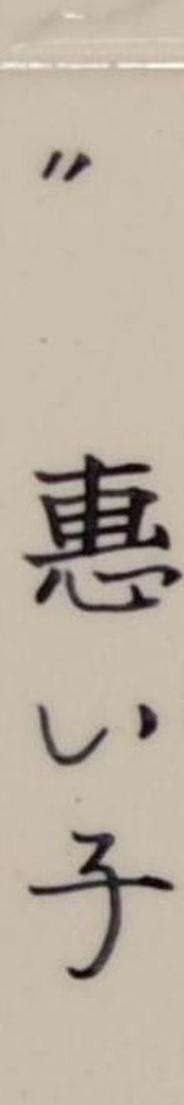けい子
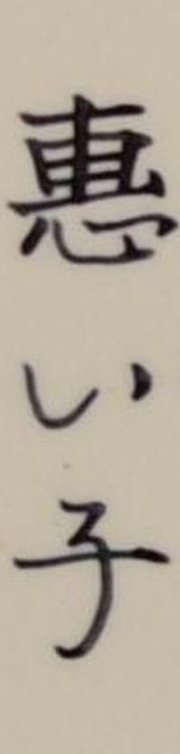けい子

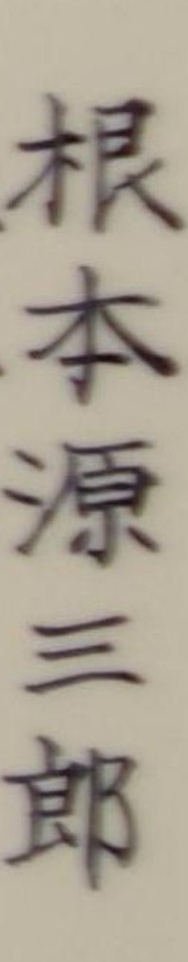根本源三郎
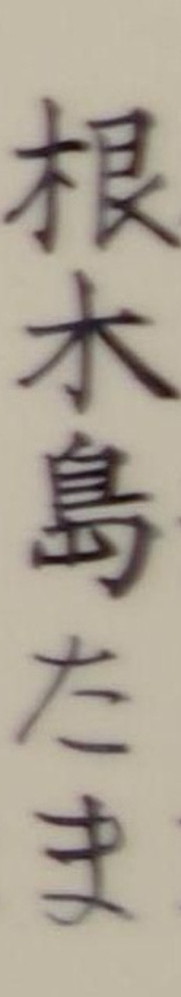根木島たま
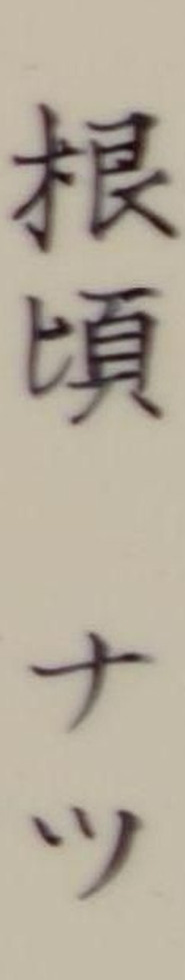根頃ナツ
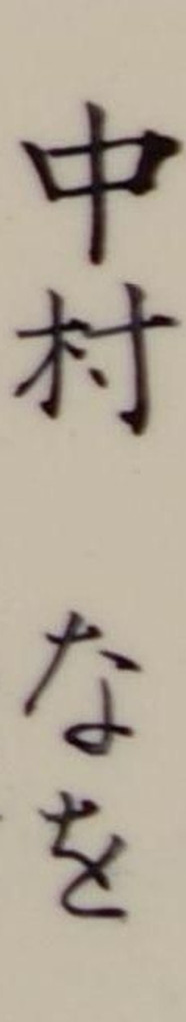中村なを
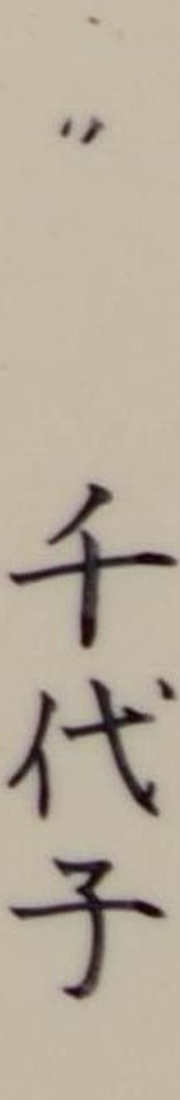千代子
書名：E~L
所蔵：高野山金剛峯寺
